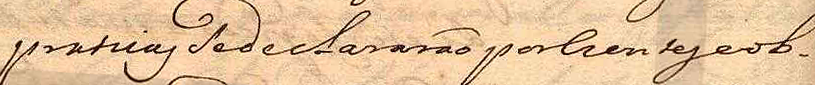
praticas se declararaõ por Crentes e ob
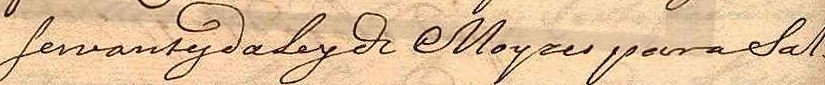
servantes da Ley de Moyzes para Sal
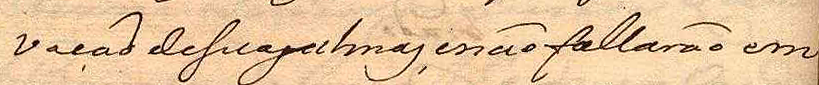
vaçaõ de suas almas, e não fallarão em
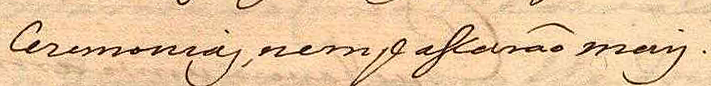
Ceremonias, nem passarão mais.
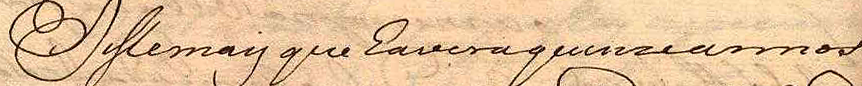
Disse mais que havera quinze annos
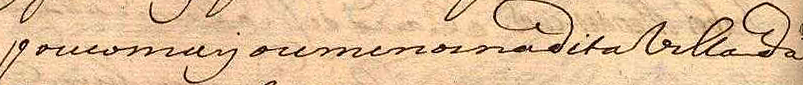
pouco mais ou menos na dita Villa da
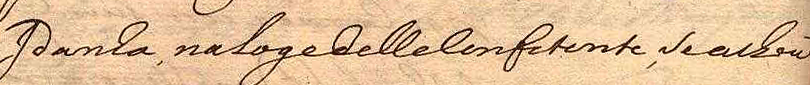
Jdanha, na Loge delle Confitente, se achou
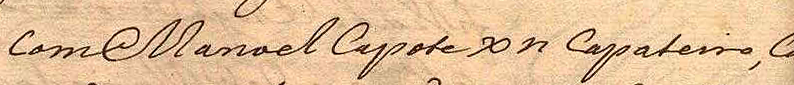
Com Manoel Capote xn Capateiro, Ca
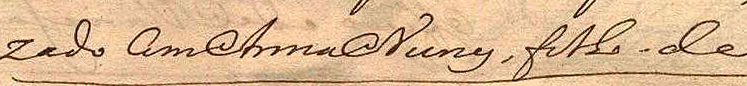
zado Com Anna Nunes, filho de
